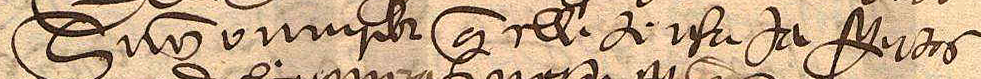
Snōr ouuydor q̄ elle tinha ja feitas
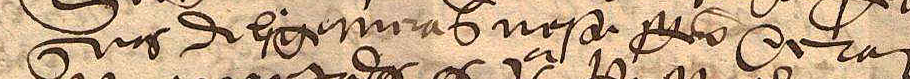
suas deljgemcias neste ftō e eram
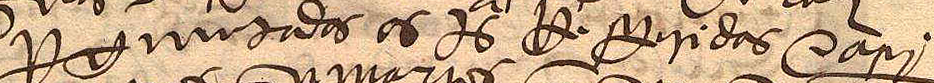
ꝑguntadas as tsa Referidas e asy
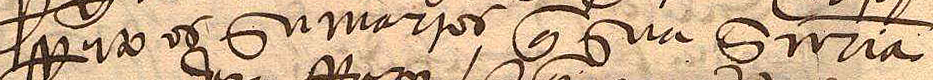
feito os sumarjos q̄ sua Snr̄ia
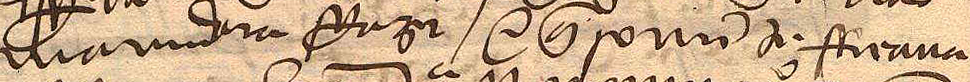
mandara fazer / e q̄ somēte ficaua
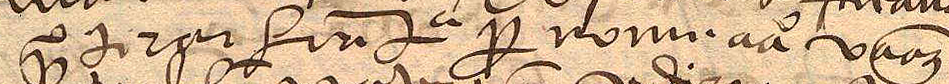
p̄o tirar huā ta ꝑ nome aao vāaz
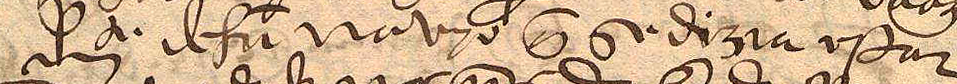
mte de hū navyo q̄ se dizia estar
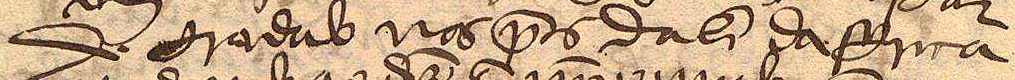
degradado nas p̄tes dalē dafrica
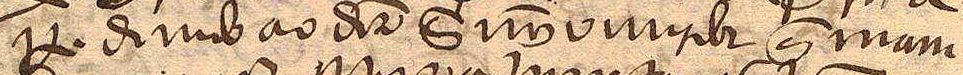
pedimdo ao dito Snōr ouujdor q̄ mam
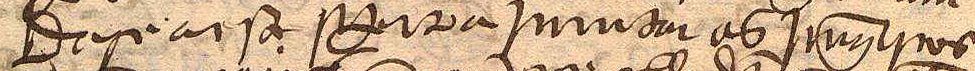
dase a este feito aJumtar as Jmq̄rjçoes
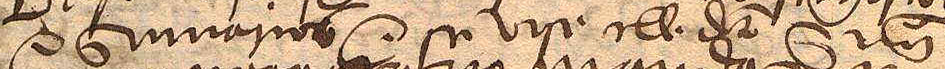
e sumarios e se vise elle dito Snōr
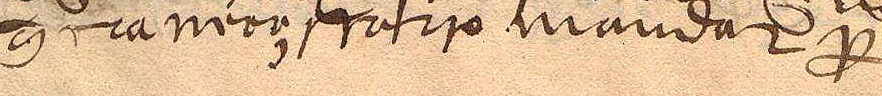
q̄ era necessarjo mandar ꝑ
